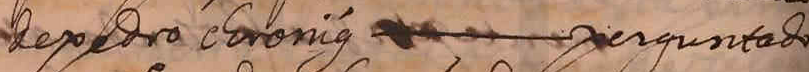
de pedro chroniḡ ________ perguntado
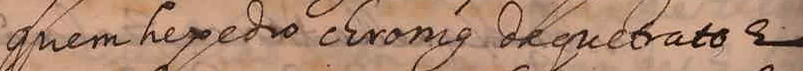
quem he pedro chroniḡ de que trato E
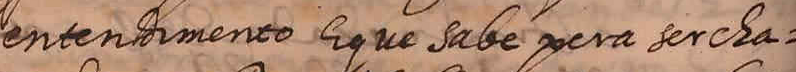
entendimento E que sabe pera ser cha
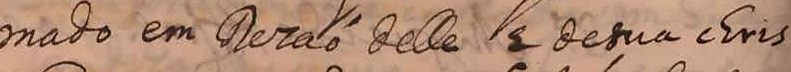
mado em Rezaõ delle E de sua chris
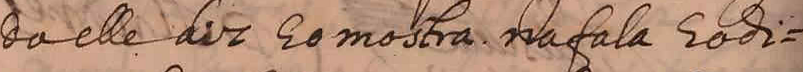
do elle diz E o mostra na fala E o di
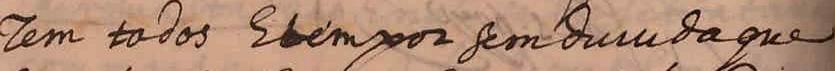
zem todos E tem por sem duuida que
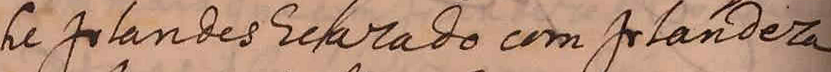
he Jrlandes E cazado com Jrlandeza
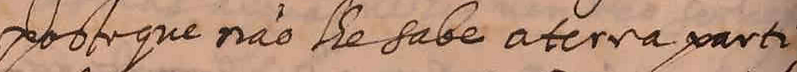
posto que naõ lhe sabe a terra parti
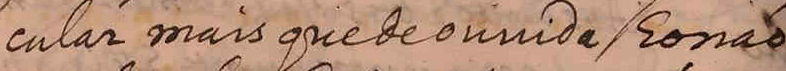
cular mais que de ouuida E o naõ
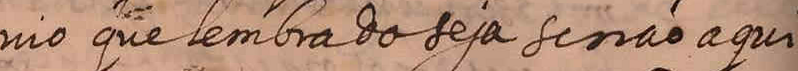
uio que lembrado seja senão aqui
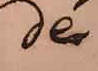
de
